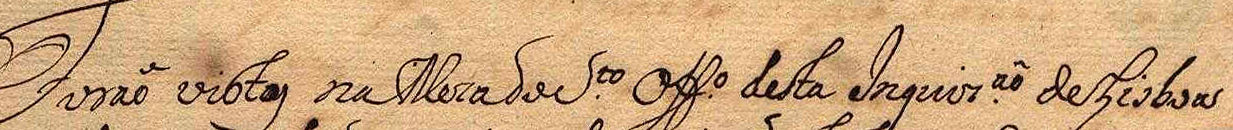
Foraõ vistos na Meza do S.to Off.o desta Inquiz.aõ de Lisboa
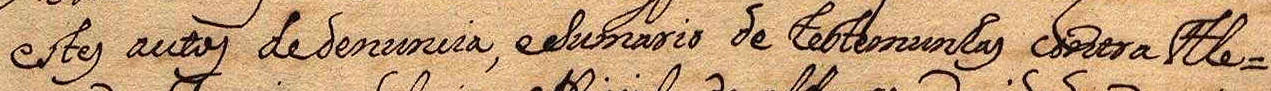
estes autos de denuncia, e Sumario de testemunhas contra Ale
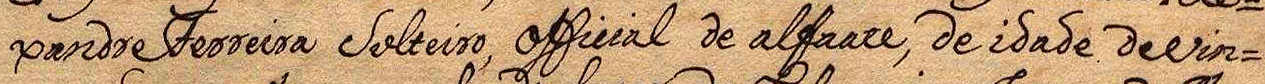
xandre Ferreira Solteiro, official de alfaate, de idade de vin
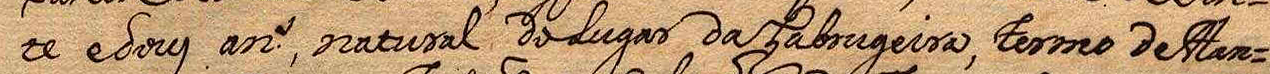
te e dous an.s, natural do Lugar da Labrugeira, termo de Alan
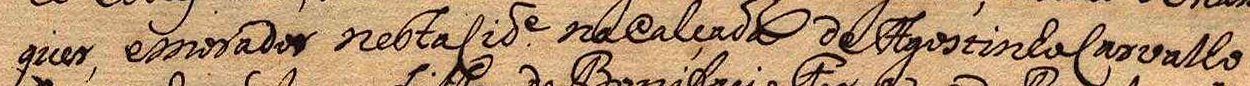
quer e morador nesta Cid.e na Calçada de Agostinho Carvalho
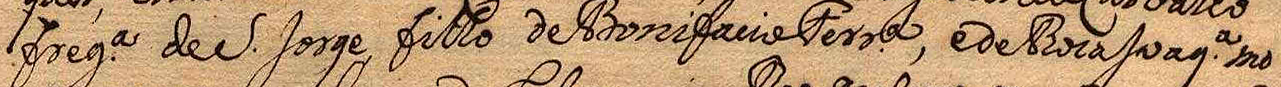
freg.a de S. Jorge filho de Bonifacio Ferr.a, e de Roza Joaq.a mo
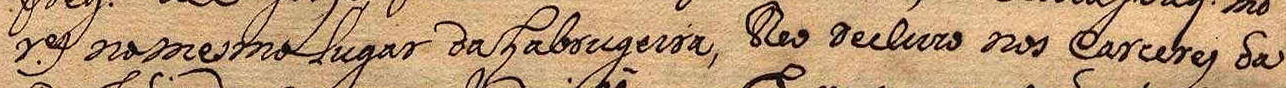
r.es no mesmo Lugar da Labrugeira, Reo recluzo nos Carceres da
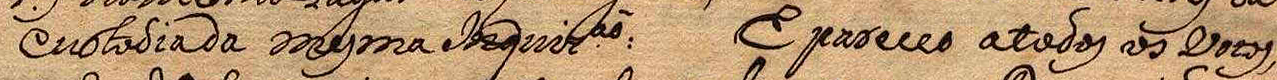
custodia da mesma Inquiz.aõ: E pareceo a todos os votos,
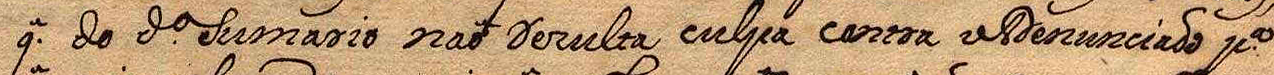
q̄ do d.o Sumario naõ rezulta culpa contra o Denunciado p.a
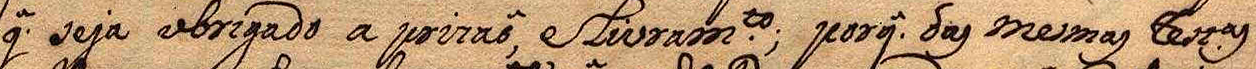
q̄ seja obrigado a prizaõ, e Livram.to; porq̄ das mesmas test.as
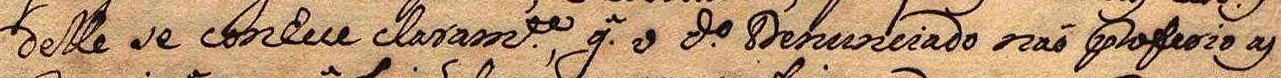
delle se conhece claram.te, q̄ o d.o Denunciado naõ pRoferio as
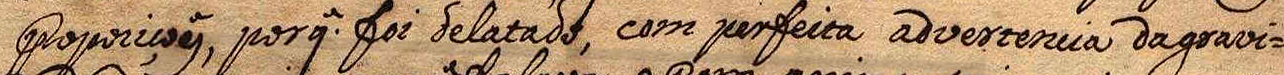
pRopoziçoẽs, porq̄ foi delatado, com perfeita advertencia da gravi
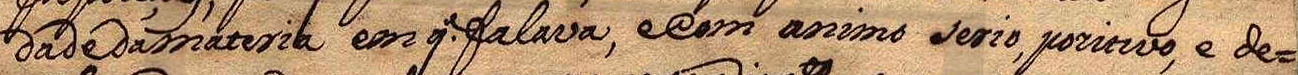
dade da materia em q̄ falava, e com animo serio, pozitivo, e de
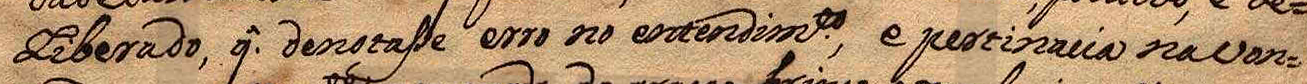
Liberado, q̄ denotasse erro no entendim.to, e pertinacia na von
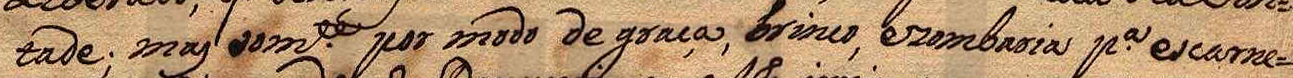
tade; mas som.te por modo de graça, brinco, e zombaria p.a escarne
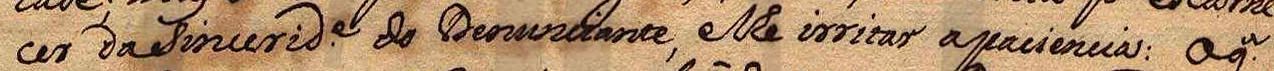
cer da Sincerid.e do Denunciante, e lhe irritar a paciencia: O q̄
